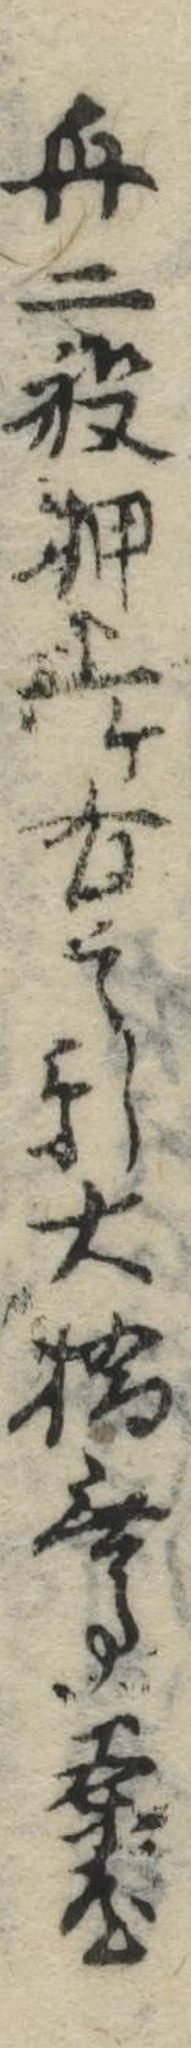舟二艘押上ケ有之新大橋無事茶屋
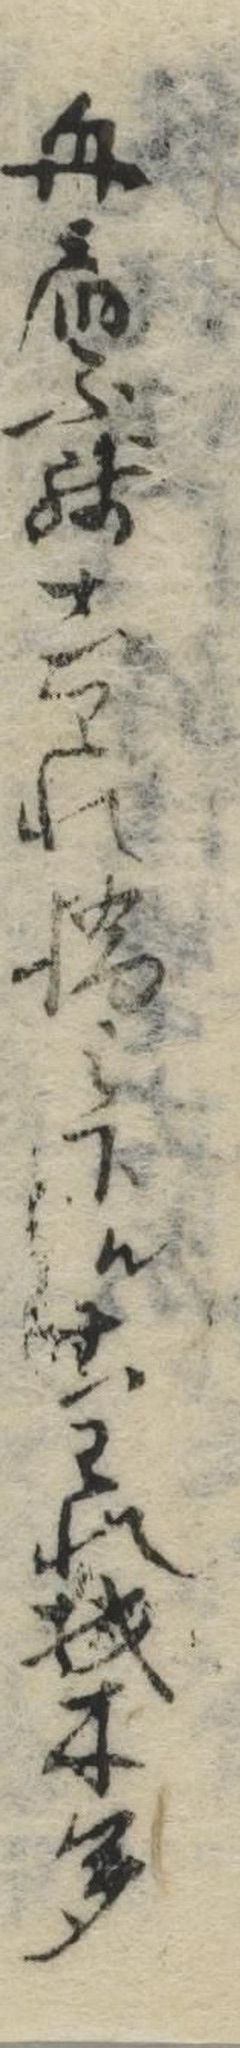舟宿不残こわれ橋の下にこわれ材木多
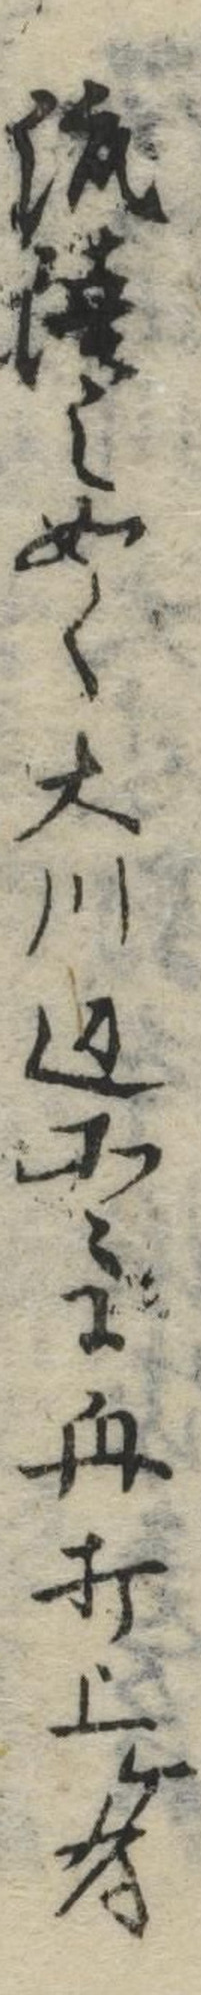流陸之如く大川辺所々に舟打上ケ有
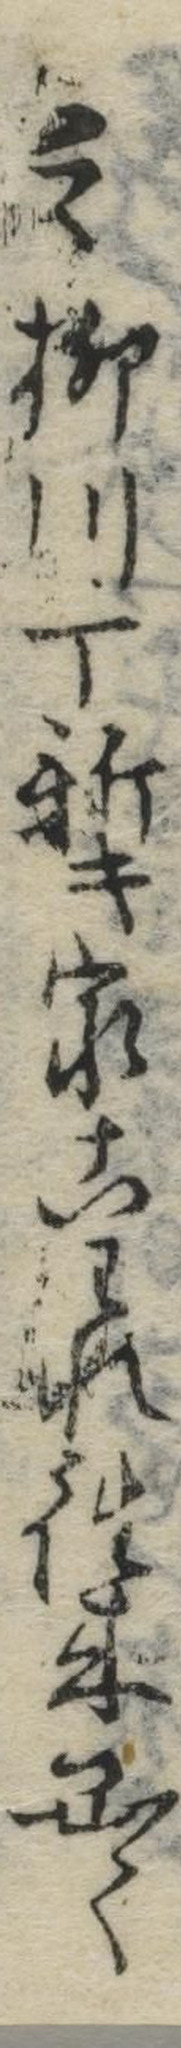之柳川丁新キ家こわれ往来無く
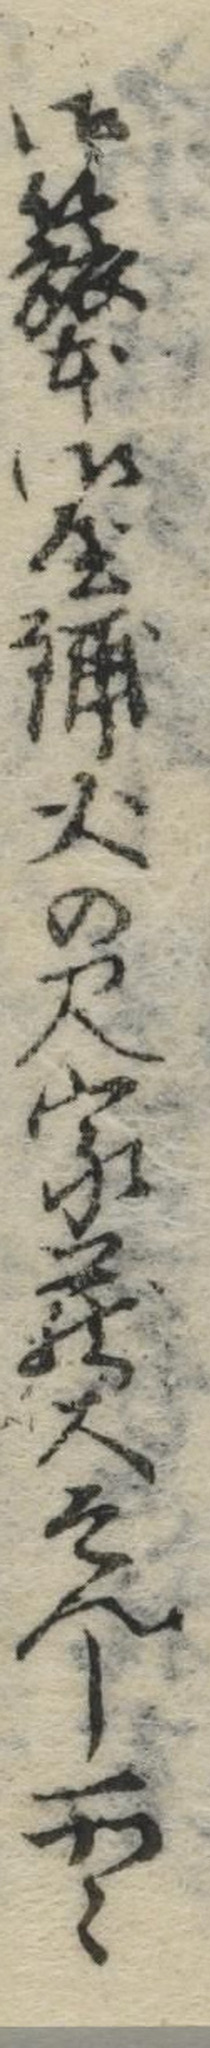御旅本御屋鋪火の見家蔵大そんし所々
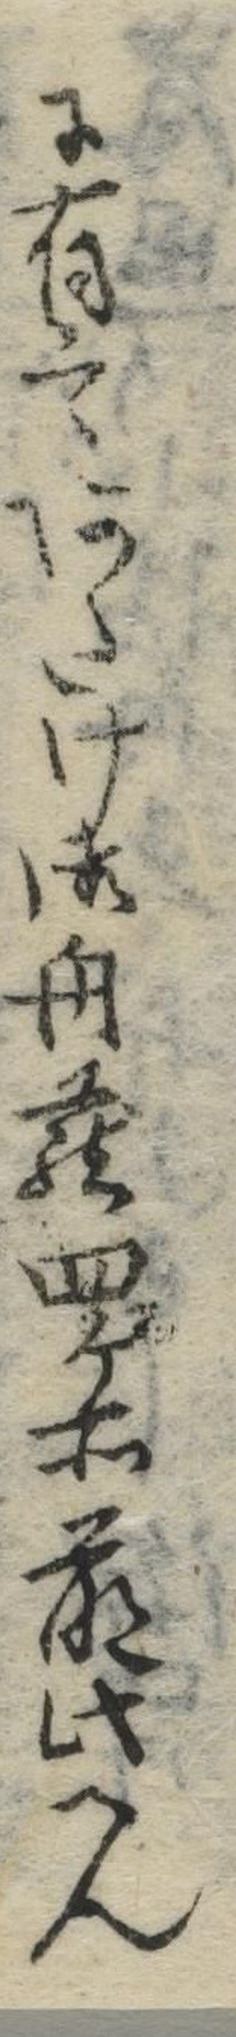に有之あたけ御舟蔵四ヶ所崩此へん
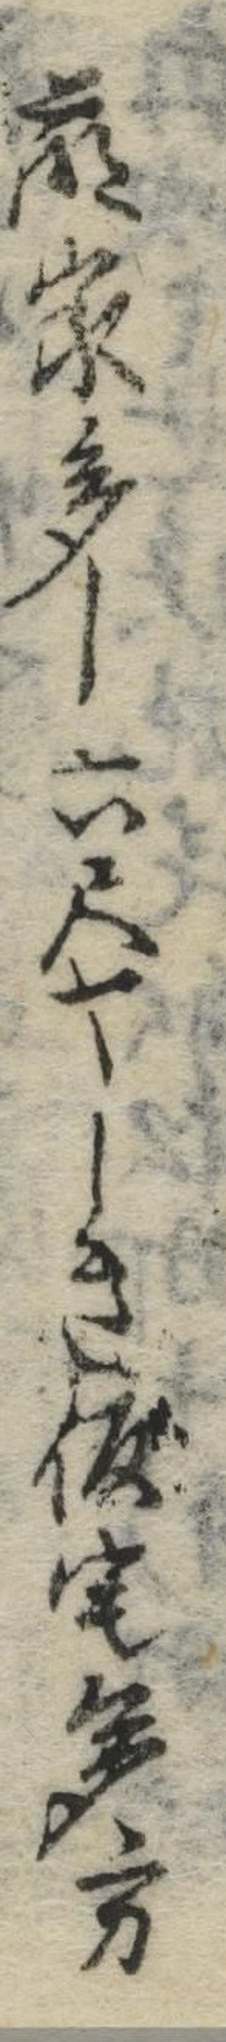崩家多し六尺ヤしき仮宅多方
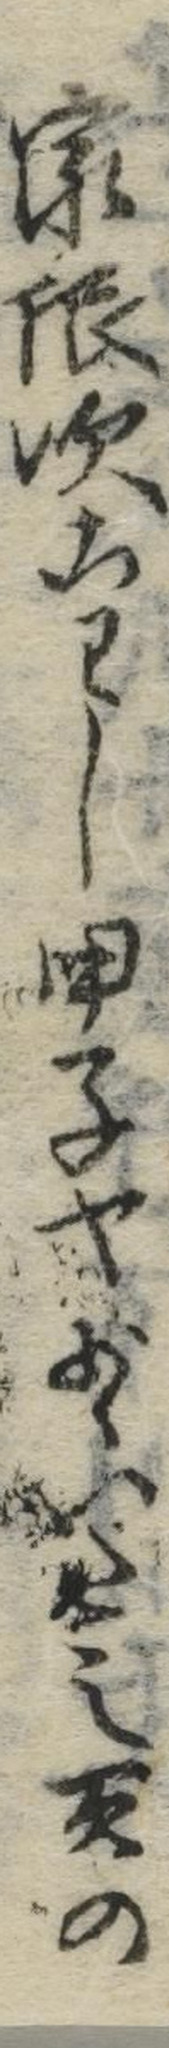家根吹こわし甲子ヤ少々いたみ亥？の
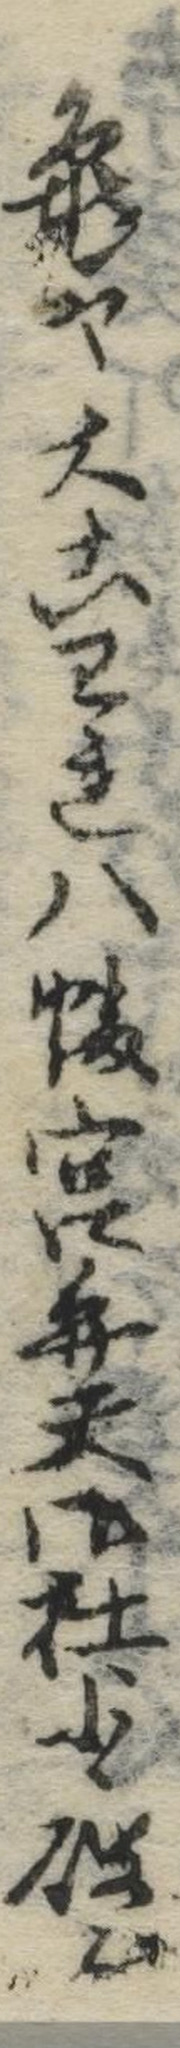亀ヤ大こわれハ幡富弁天御社少破れ
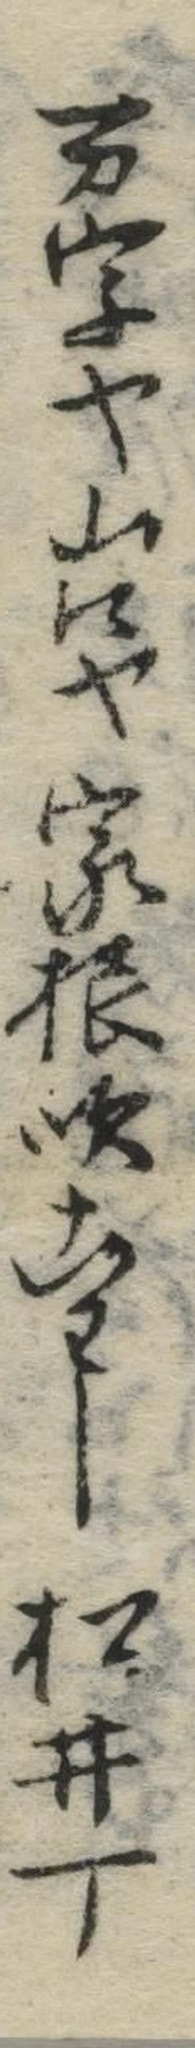万字ヤ山口ヤ家根吹こわし松井丁
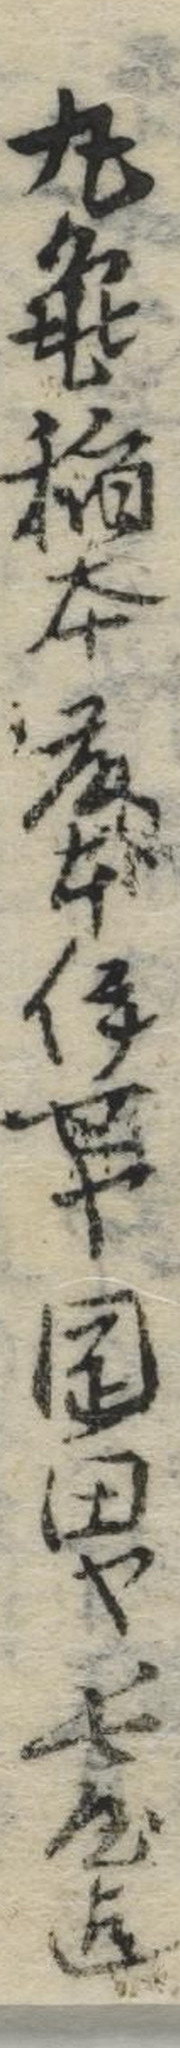丸亀稲本藤本いせヤ岡田長屋迄
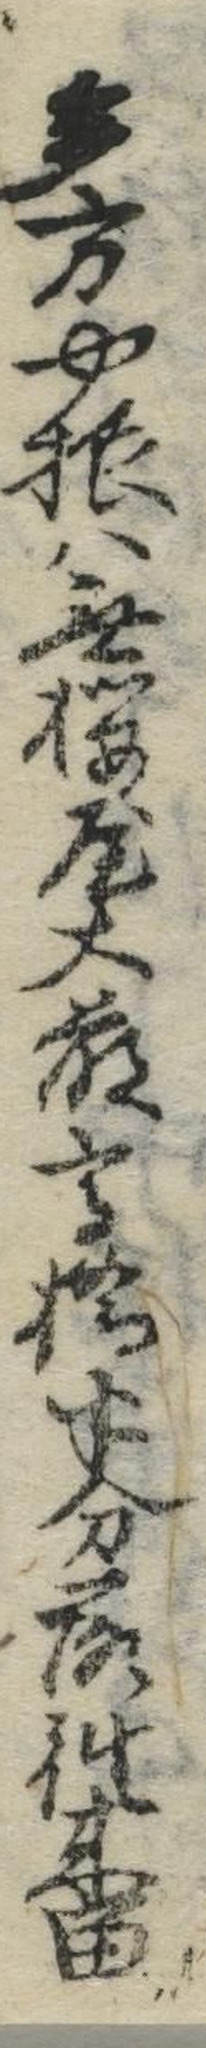多方や根ハ無桜屋大崩高橋半分崩往来留
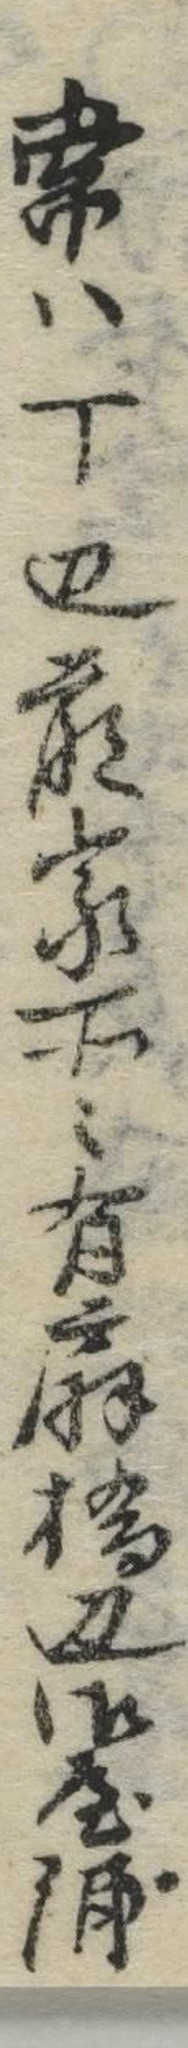常ハ丁辺崩所々有扇橋辺御屋鋪
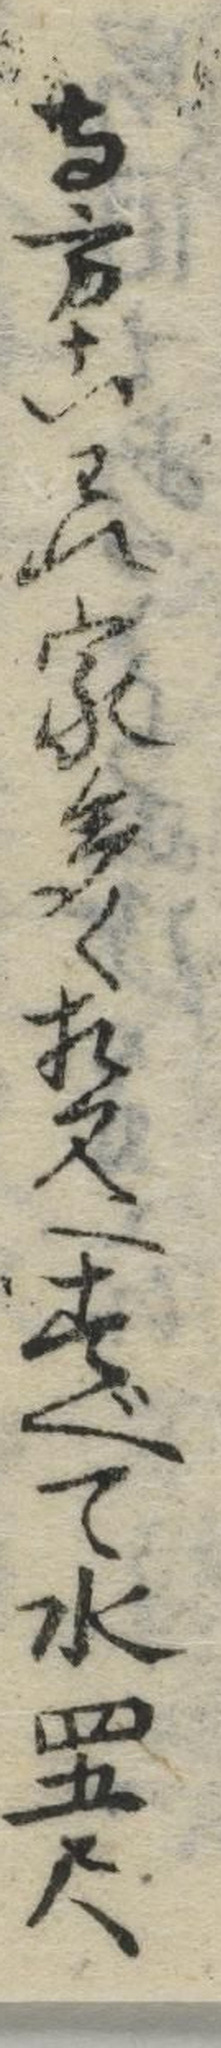寺方こわれ家多く相見へすべて水四五尺
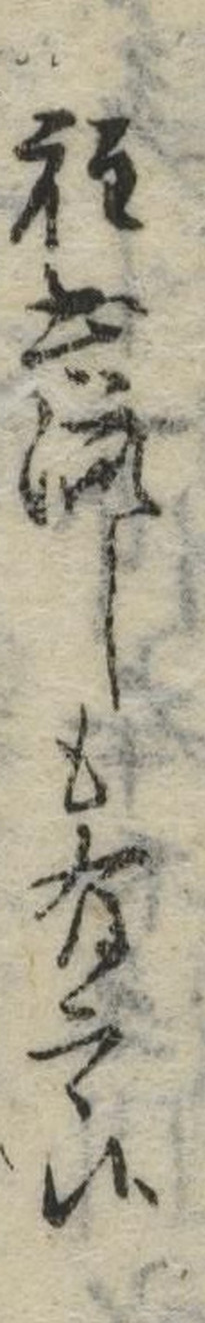程出流しも有之候
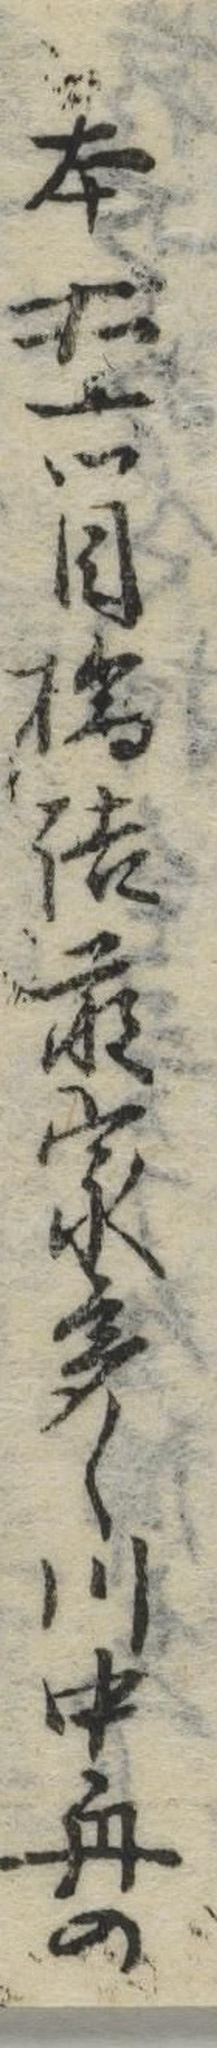本所一ッ目橋詰崩家多く川中舟の
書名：安政三年辰八月廿五日夜　大江都御屋敷方寺社市中共　大嵐水入場所明細書之寫　并街道筋近郷聞書
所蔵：東京大学地震研究所図書室 Earthquake Research Institute Library, The University of Tokyo, JAPAN
